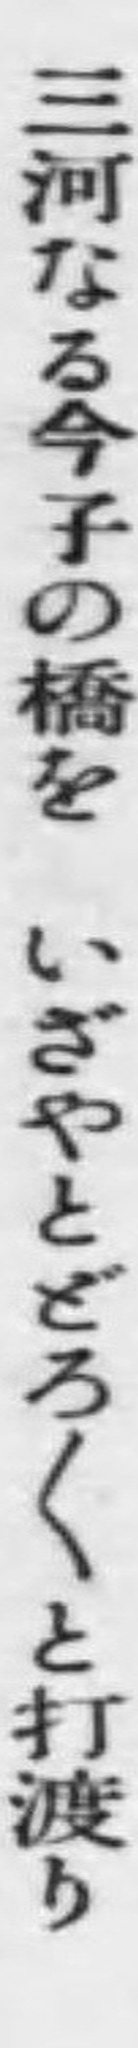三河なる今子の橋をいざやとどろ〳〵と打渡り
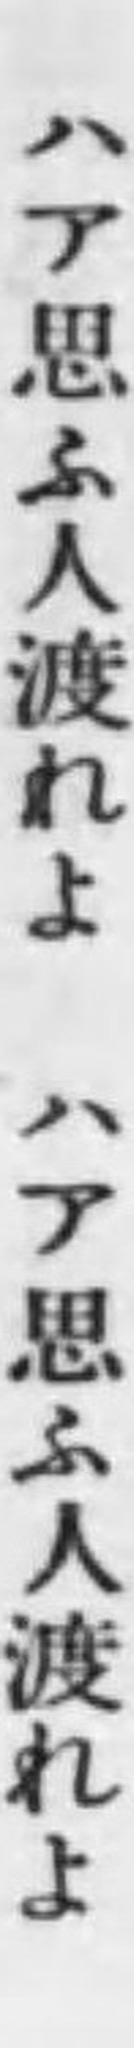ハア思ふ人渡れよハア思ふ人渡れよ
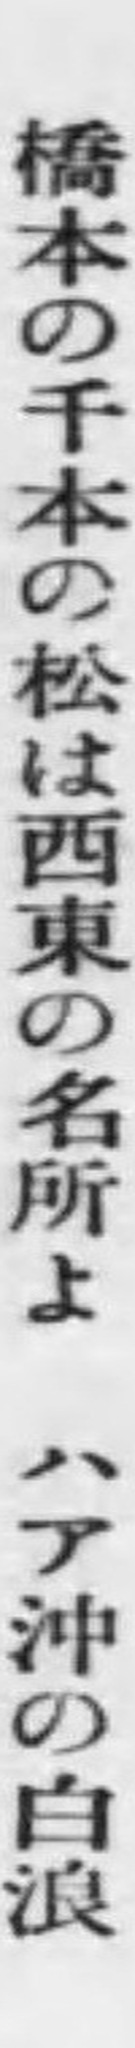橋本の千本の松は西東の名所よハア沖の白浪
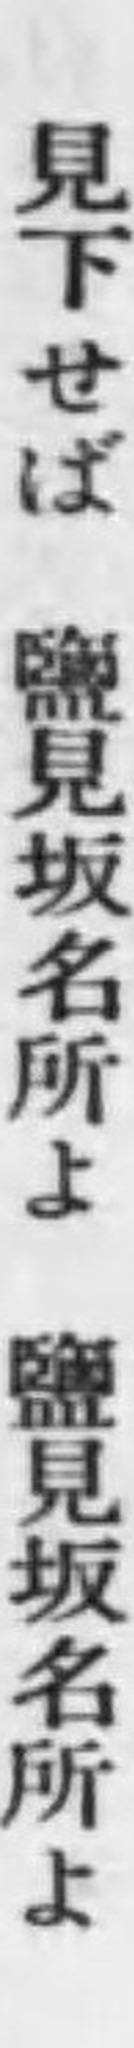見下せば鹽見坂名所よ鹽見坂名所よ
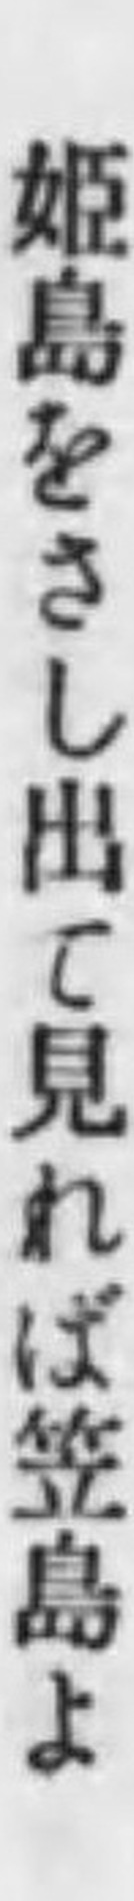姫島をさし出て見れば笠島よ
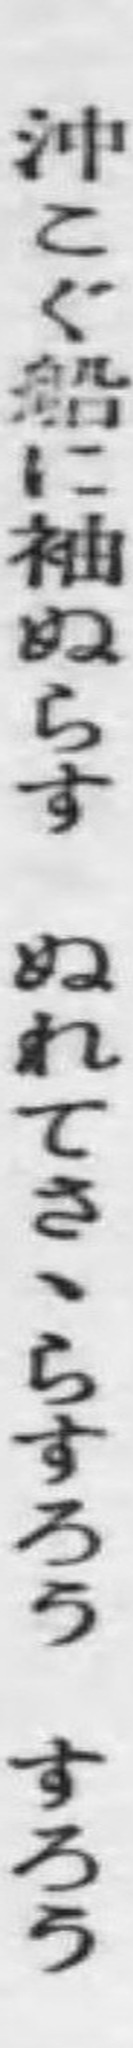沖こぐ船に袖ぬらすぬれてさヽらすろうすろう
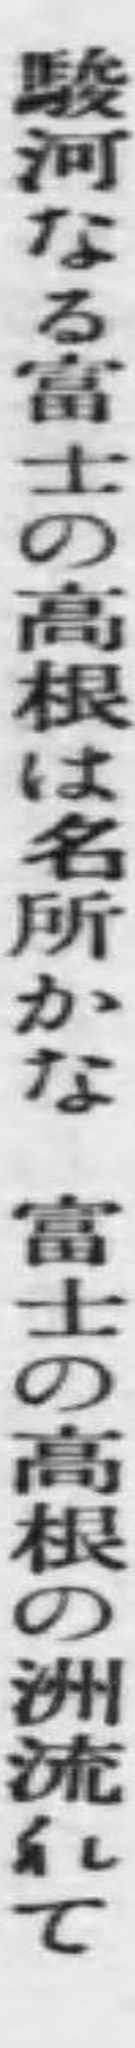駿河なる富士の高根は名所かな富士の高根の洲流れて
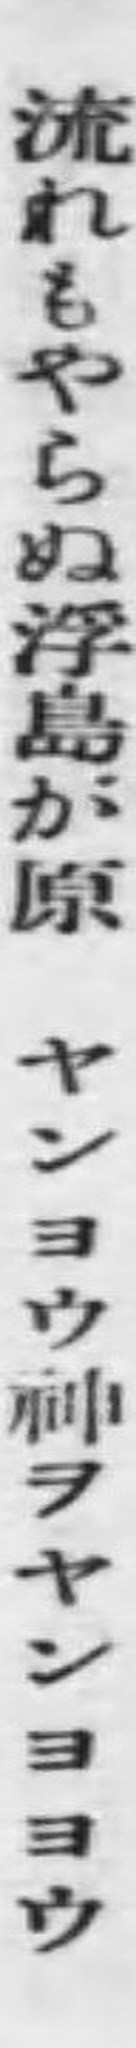流れもやらぬ浮島が原ヤンヨウ神ヲヤンヨヨウ
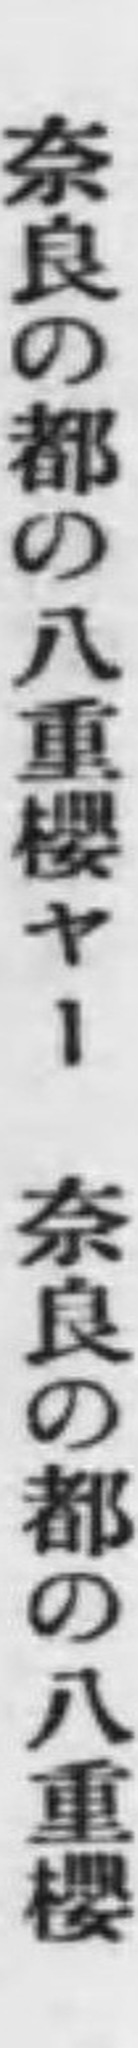奈良の都の八重櫻ヤー奈良の都の八重櫻
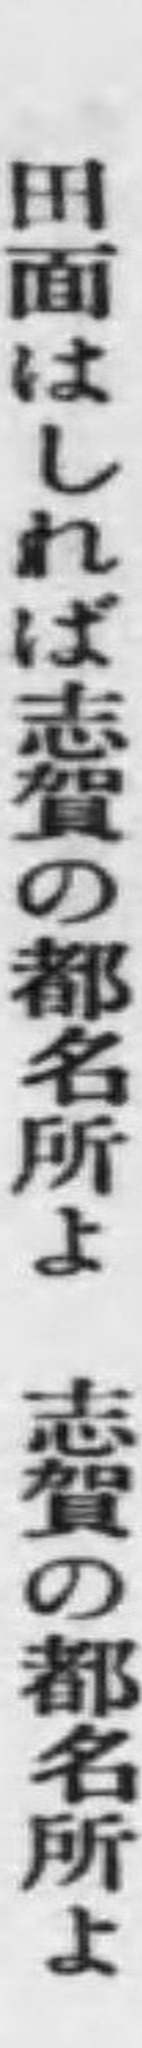田面はしれば志賀の都名所よ志賀の都名所よ
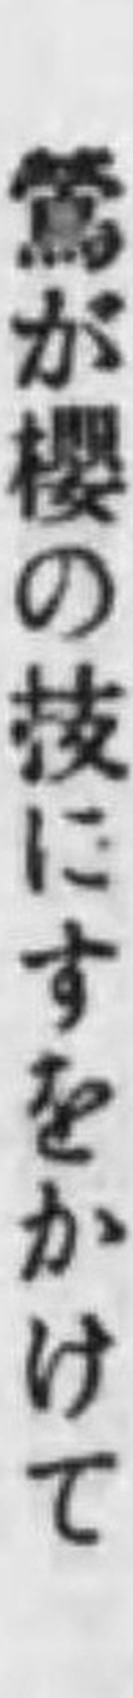鶯が櫻の枝にすをかけて
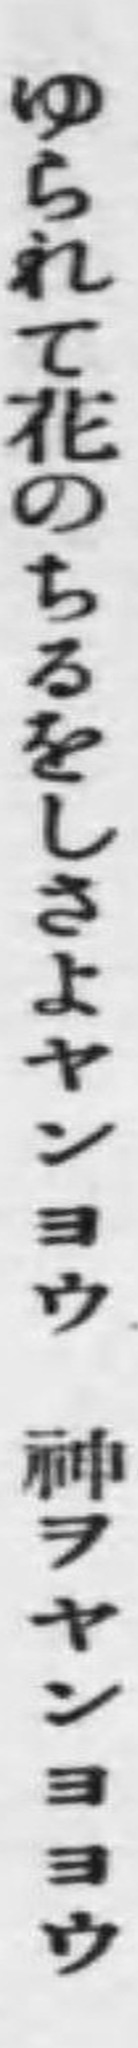ゆられて花のちるをしさよヤンヨウ神ヲヤンヨヨウ
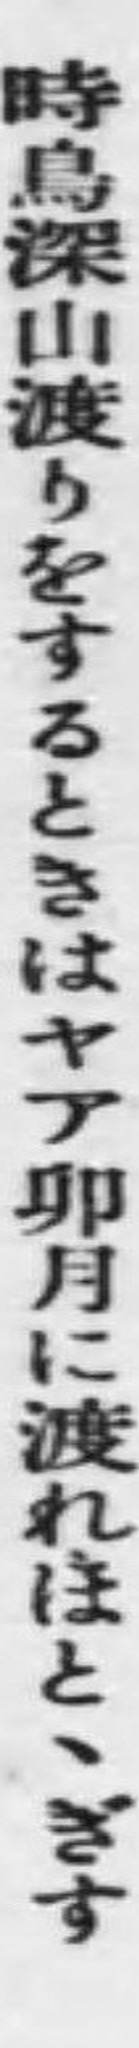時鳥深山渡りをするときはヤア卯月に渡れほとヽぎす
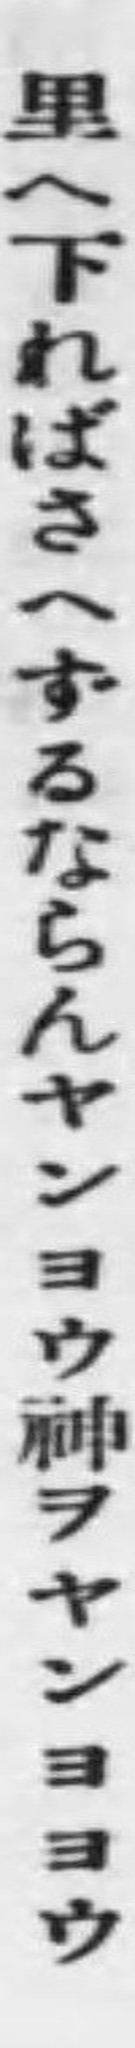里へ下ればさへずるならんヤンヨウ神ヲヤンヨヨウ
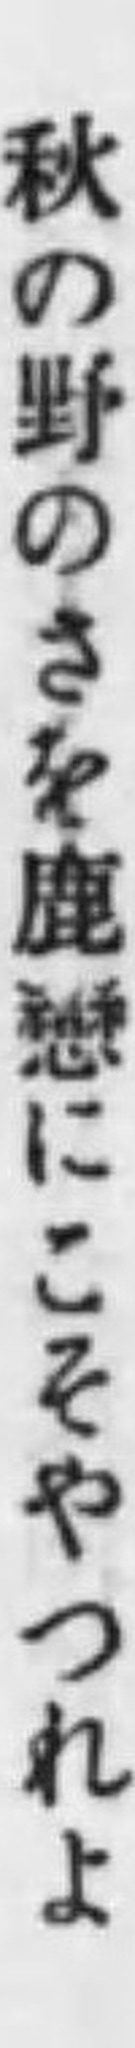秋の野のさを鹿戀にこそやつれよ
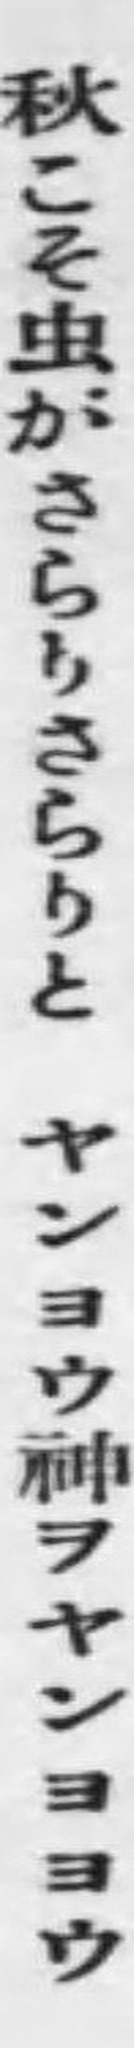秋こそ虫がさらりさらりとヤンヨウ神ヲヤンヨヨウ
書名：東三河道中記 : 豊橋市及其附近案内
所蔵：国立国会図書館 National Diet Library, JAPAN
